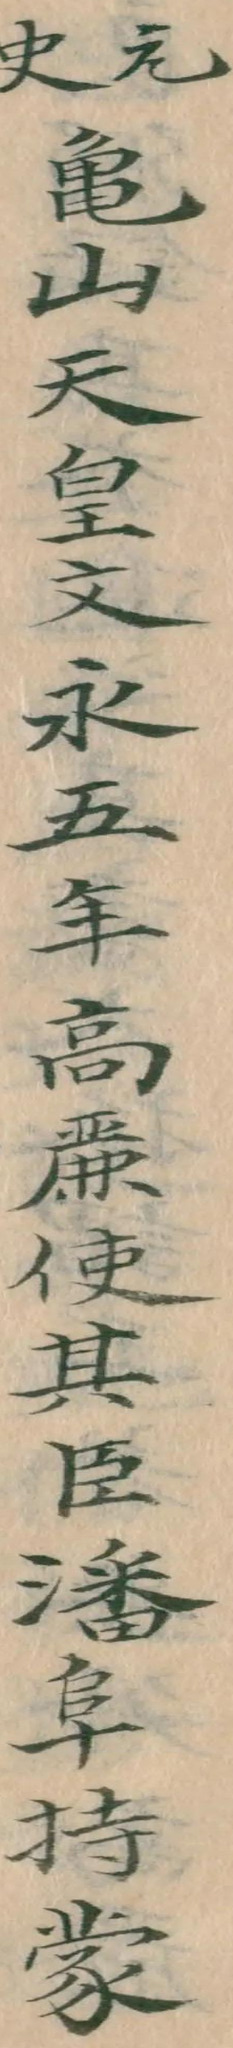元史亀山天皇文永五年高麗使其臣潘阜持蒙
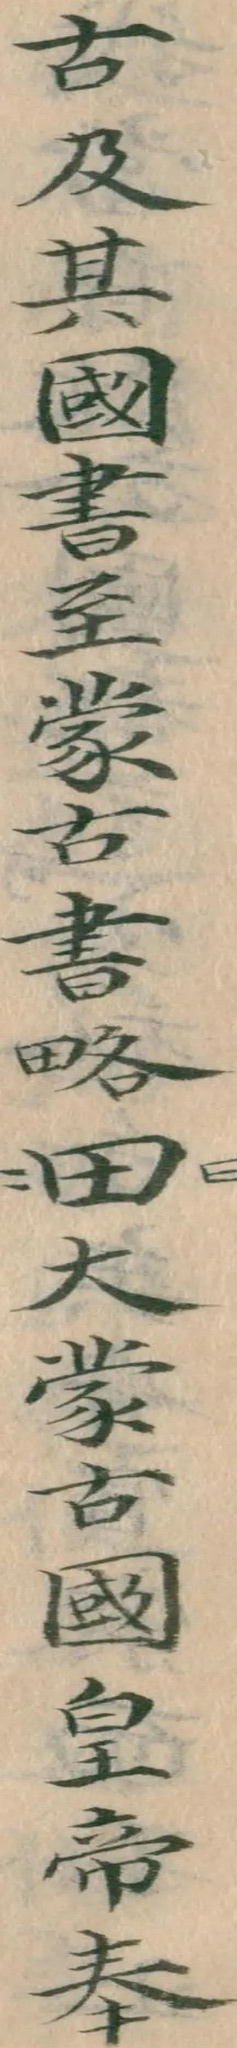古及其国書至蒙古書略田曰大蒙古国皇帝奉
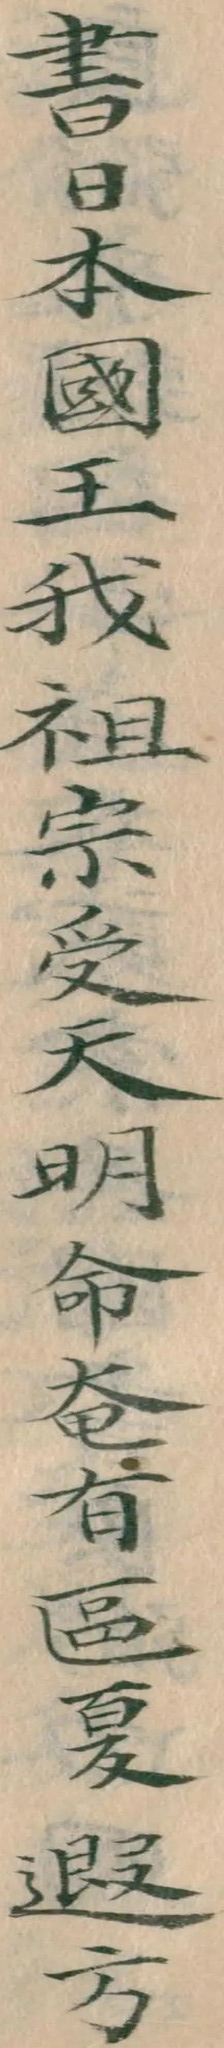書日本国王我祖宗受天明命奄有区夏遐方
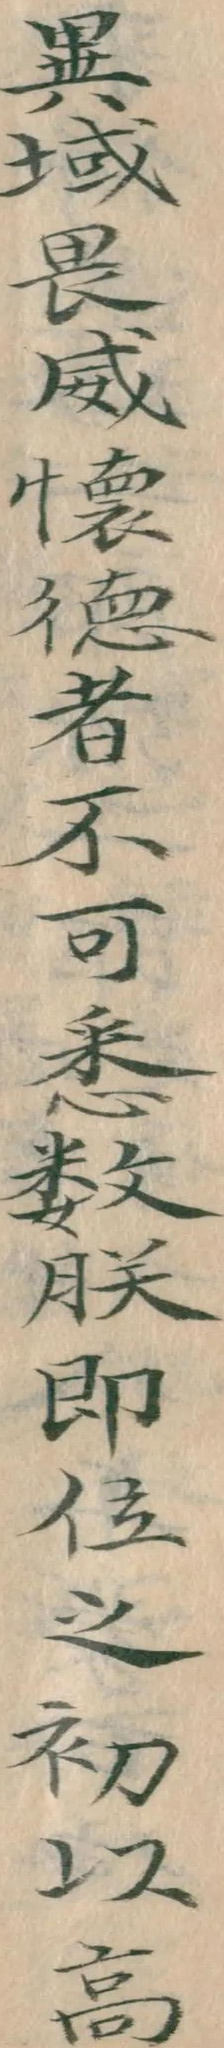異域畏威懐徳者不可悉数朕即位之初以高
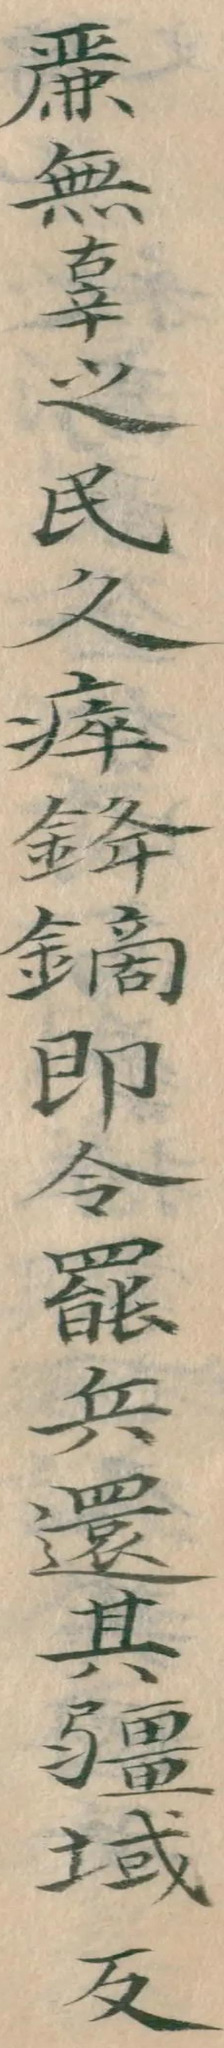麗無辜之民久瘁鋒鏑即令罷兵還其疆域反
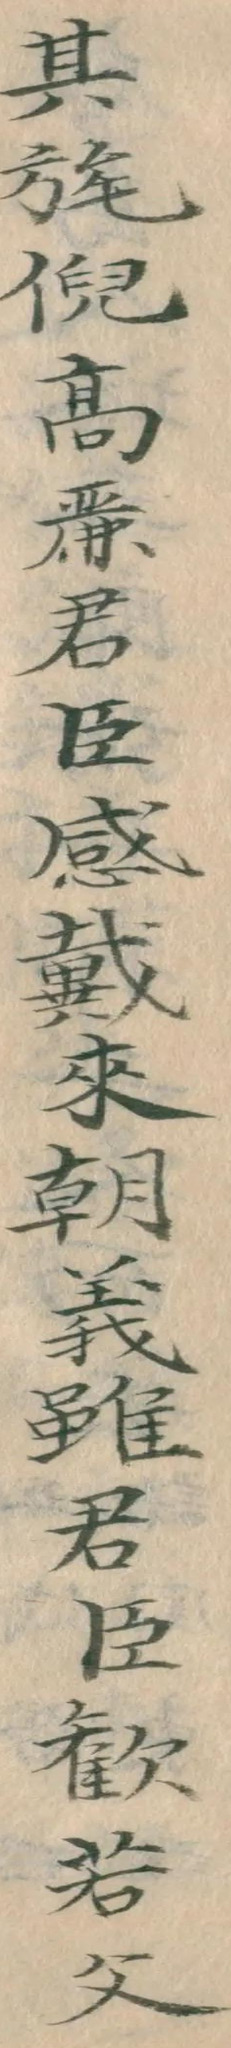其旄倪高麗君臣感戴来朝義雖君臣歓若父
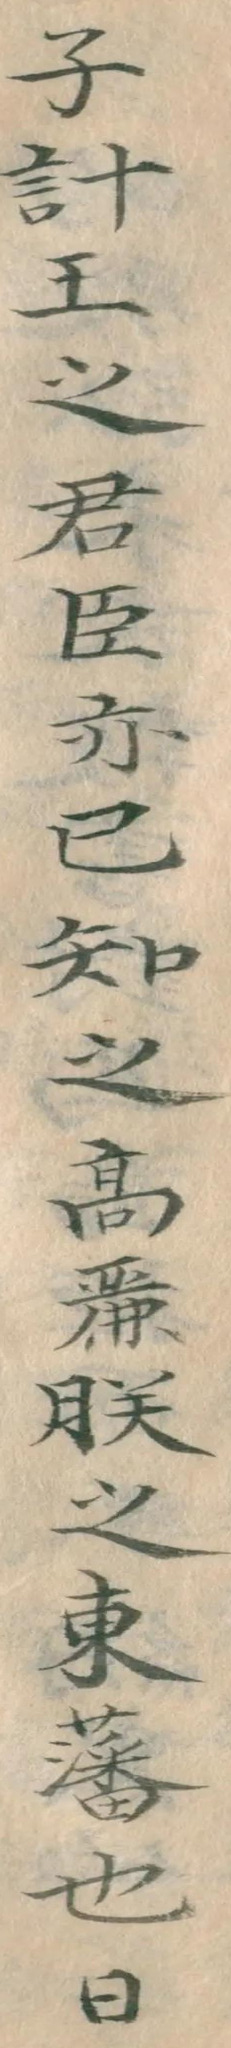子計王之君臣亦已知之高麗朕之東藩也日
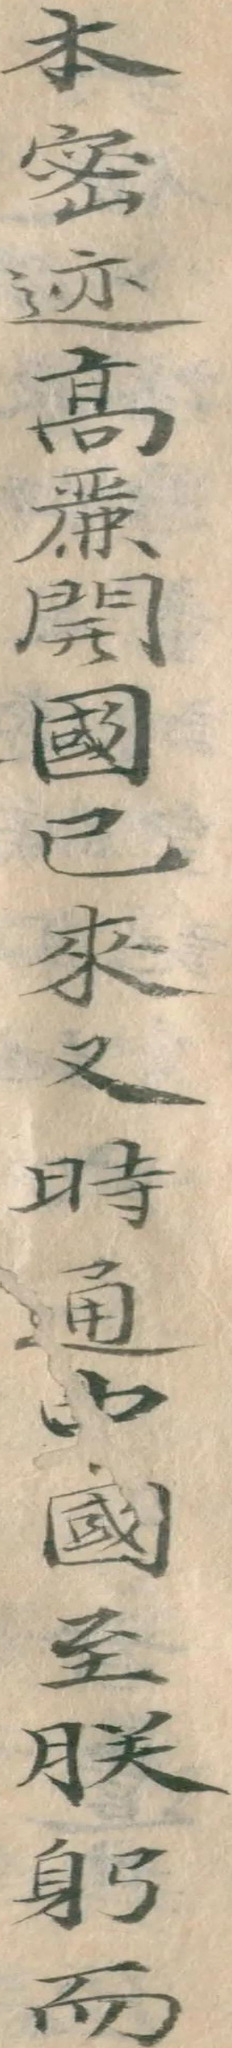本密跡高麗開国已来又時通中国至朕躬而
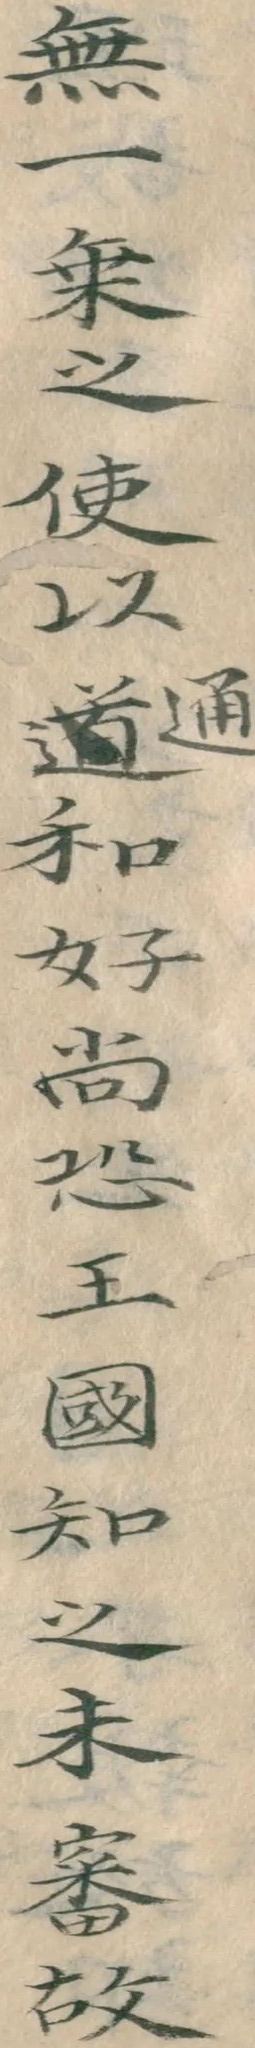無一乗之使以道通和好尚恐王国知之未審故
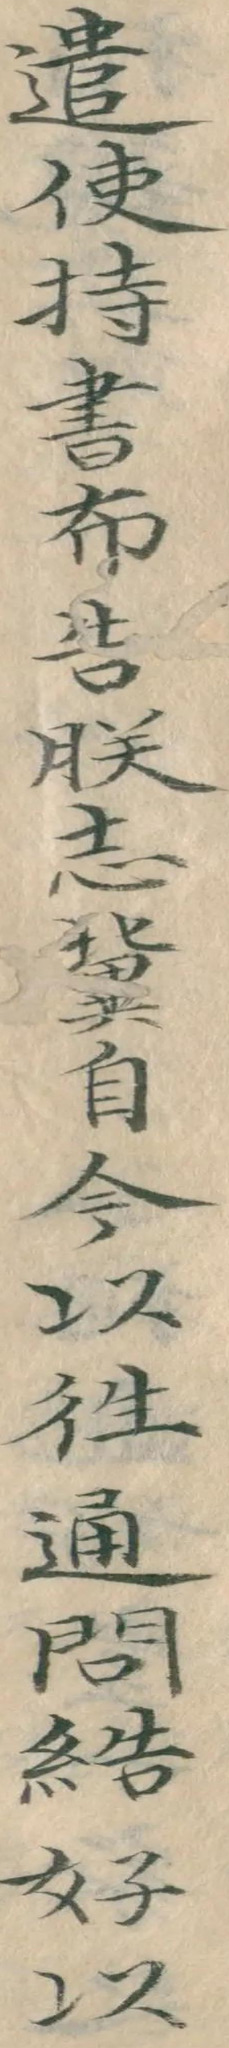遣使持書布告朕志冀自今以往通問結好以

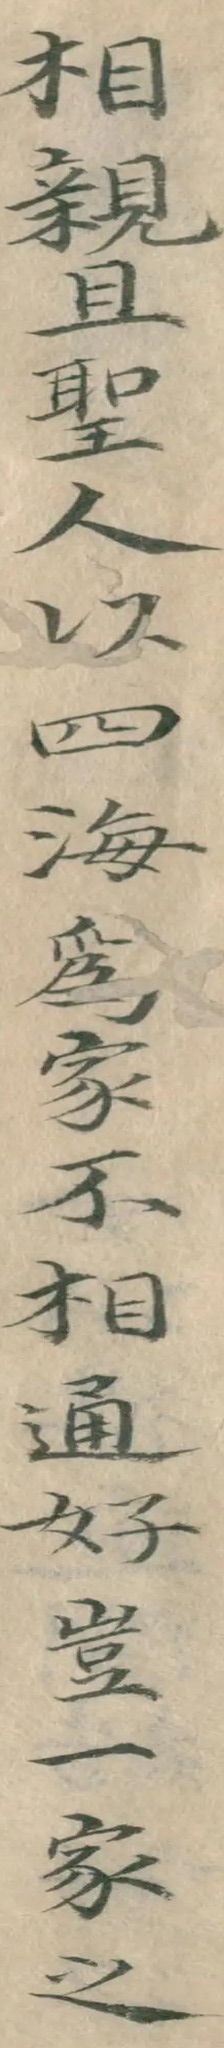相親且聖人以四海為家不相通好豈一家之
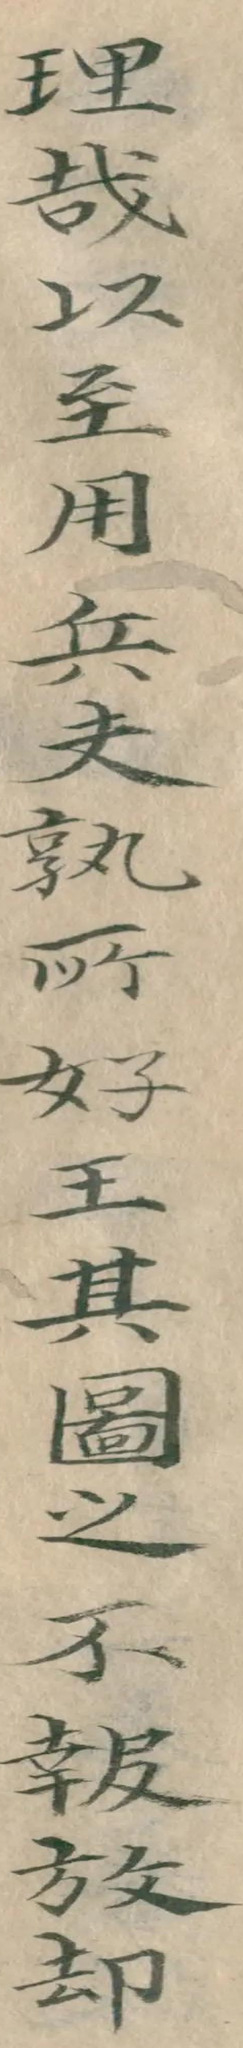理哉以至用兵夫孰所好王其図之不報放却
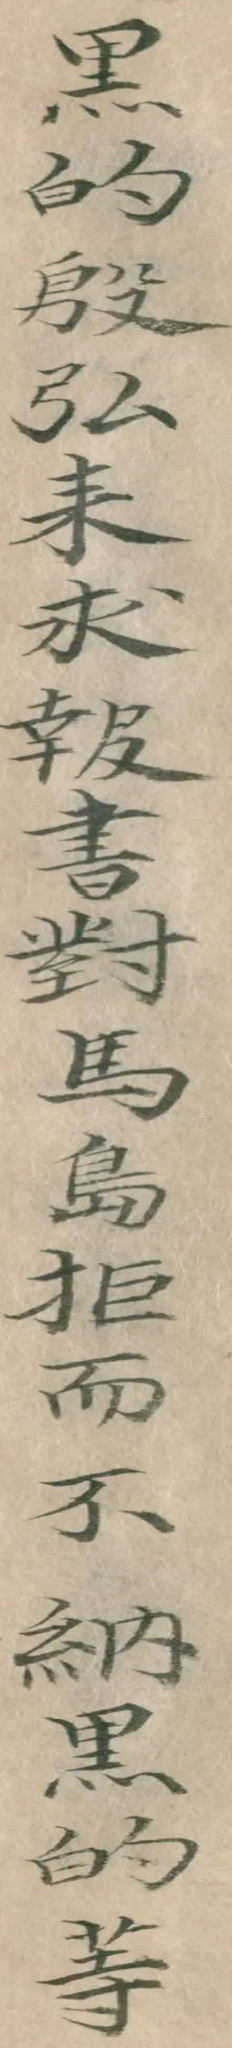黒的殷弘来求報書対馬島拒而不納黒的等
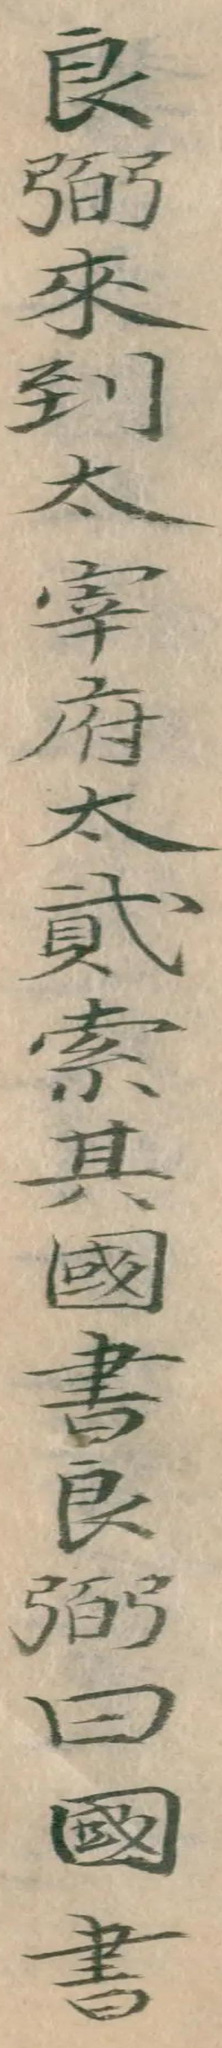良弼来到太宰府太貮索其国書良弼曰国書
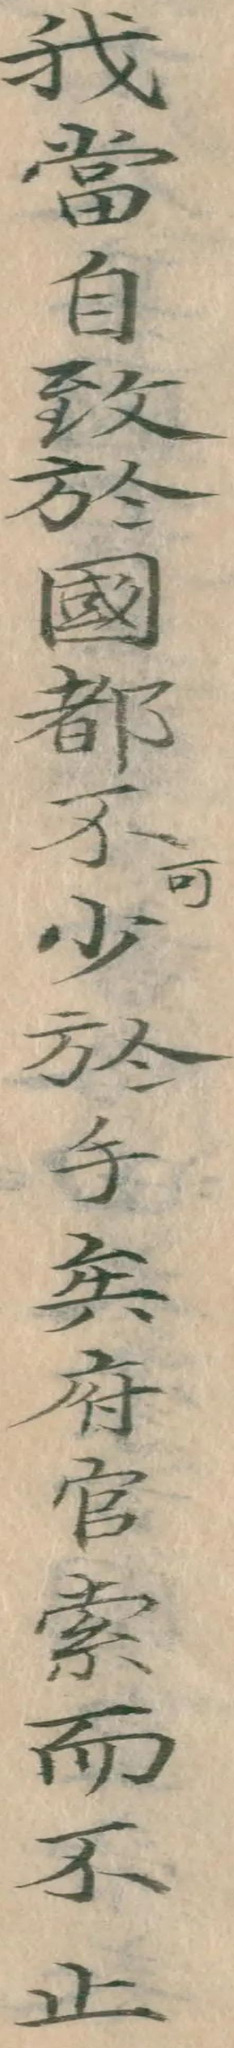我当自致於国都不可少於手矣府官索而不止
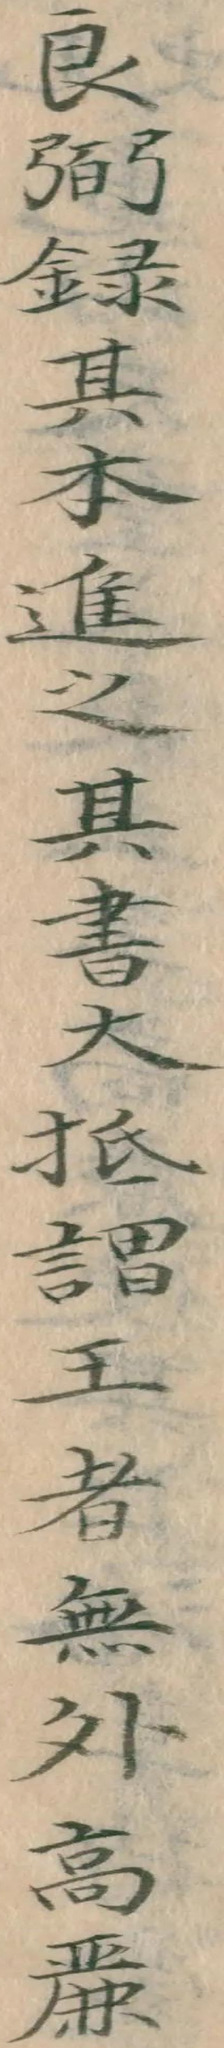良弼録其本進之其書大抵謂王者無外高麗
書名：輪池叢書. 12
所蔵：国立国会図書館 National Diet Library, JAPAN
